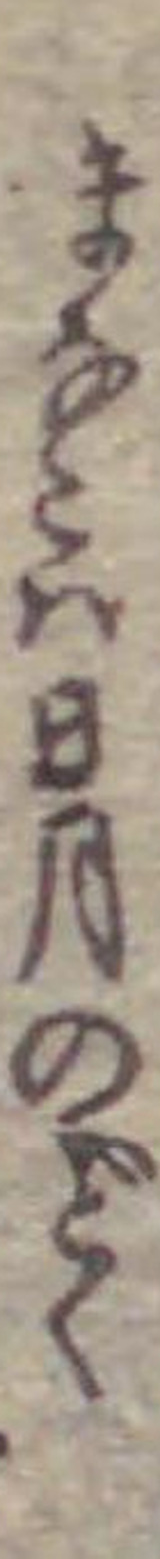まなこは日月のごとく
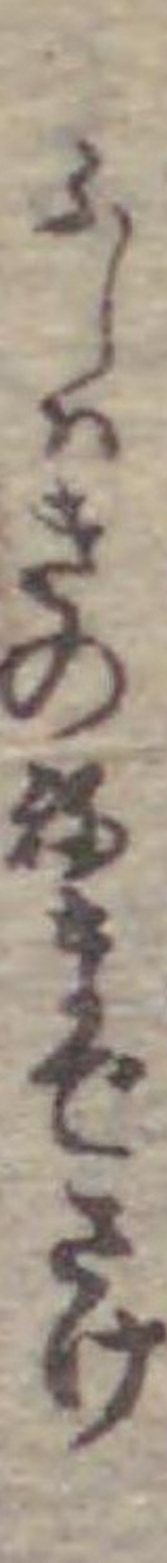ふしはきのねまでさけ
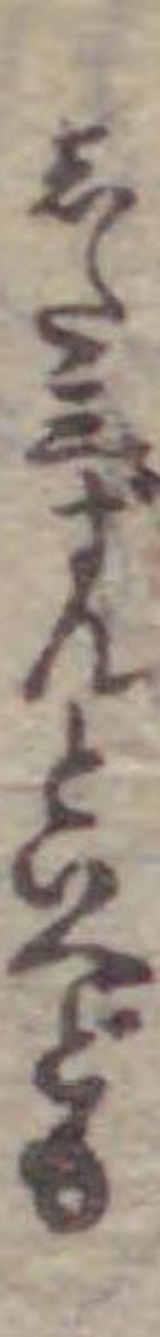した三ずんといへども
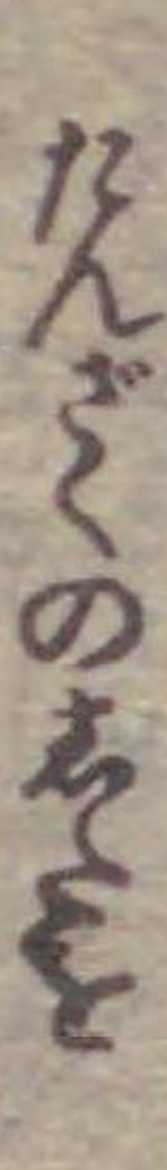たんざくのしたを
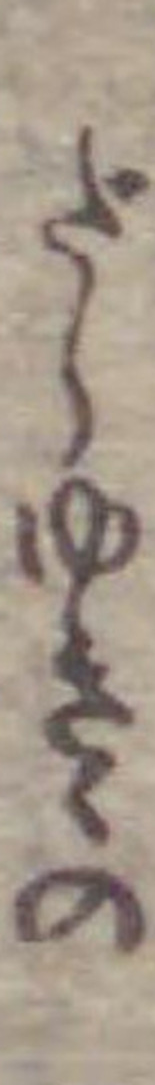だしゆきゝの
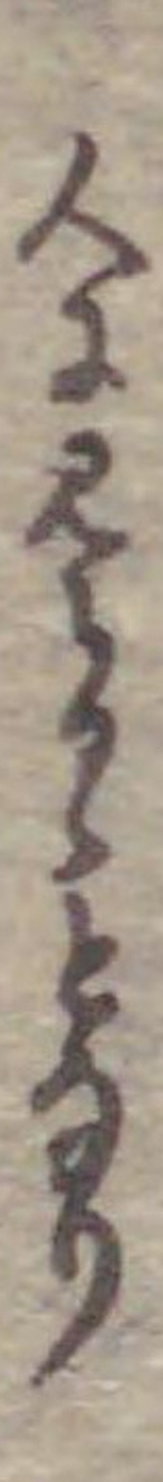人に見らるゝとなり

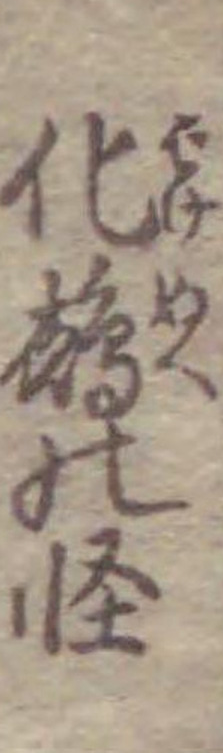化鵺の怪
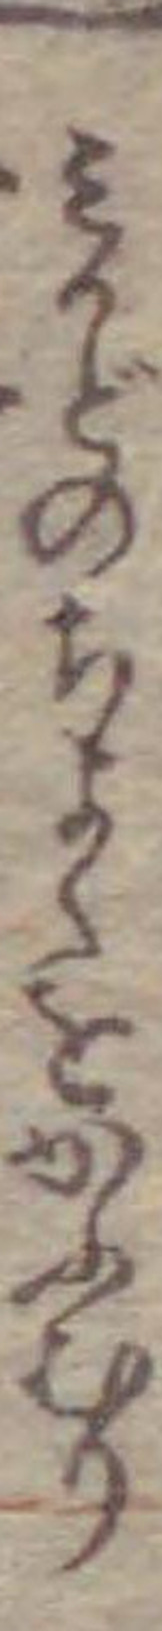みかどのちよくをかふむり
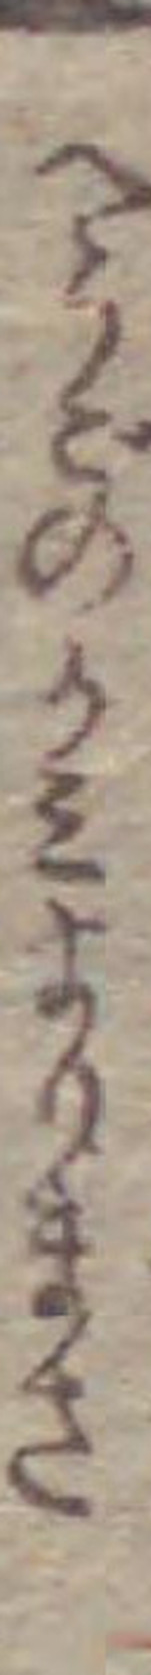へうごのかみよりまさ
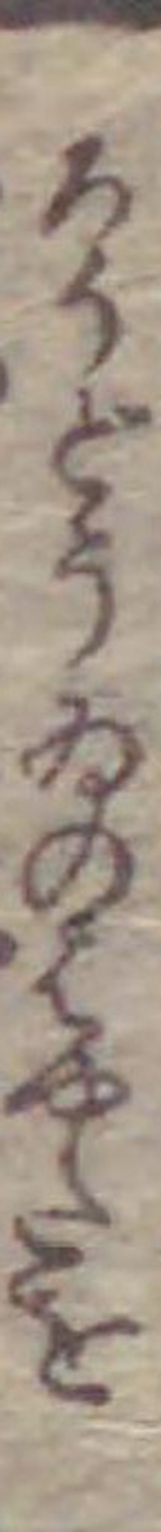ろうどうゐのはやたを
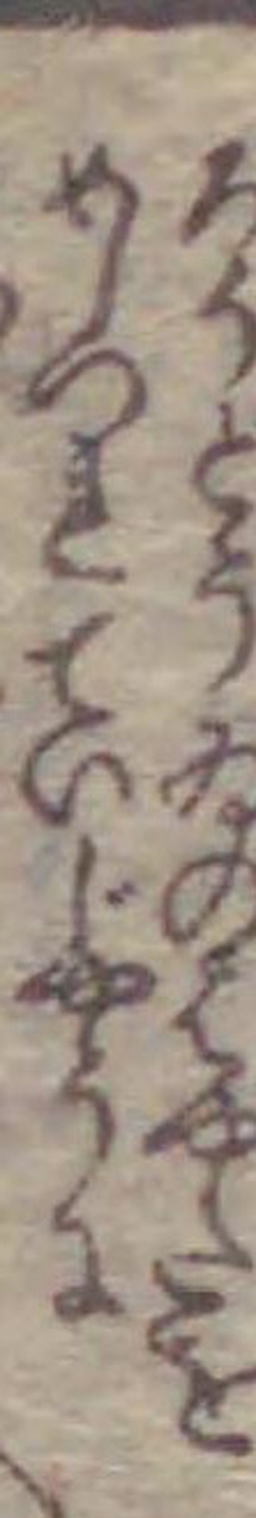めしつれていじやうに
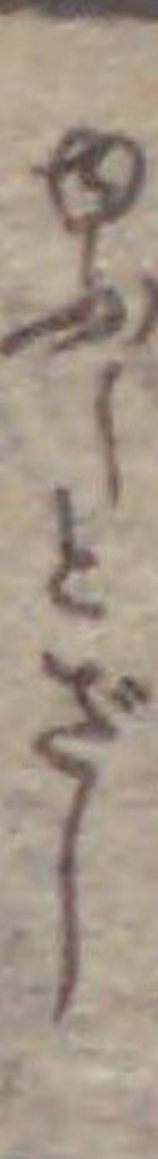ゆふ〳〵とざし
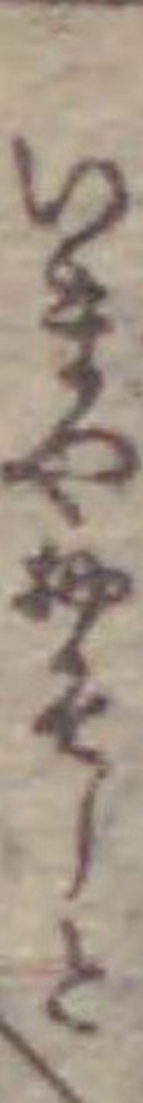いまやおそしと
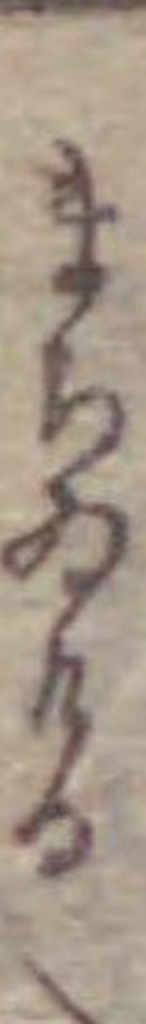まちゐける
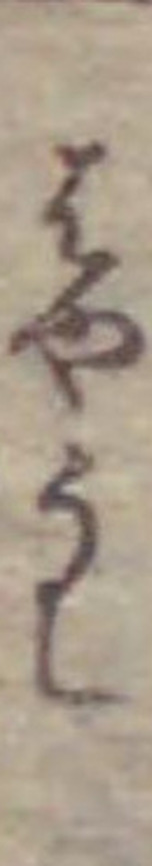はやうし
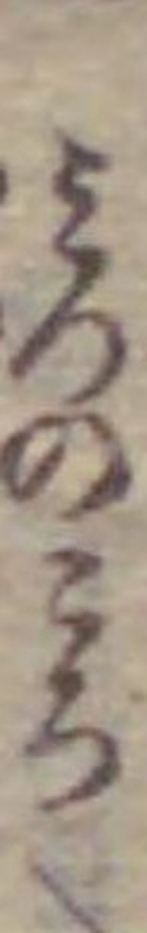みつのころ
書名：武家物奇談 : 3巻
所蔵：国立国会図書館 National Diet Library, JAPAN
